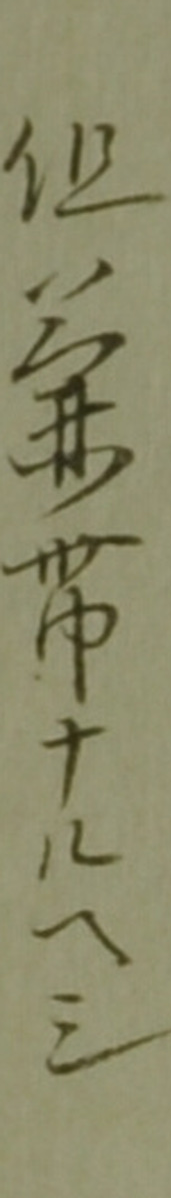但兼帯ナルヘシ
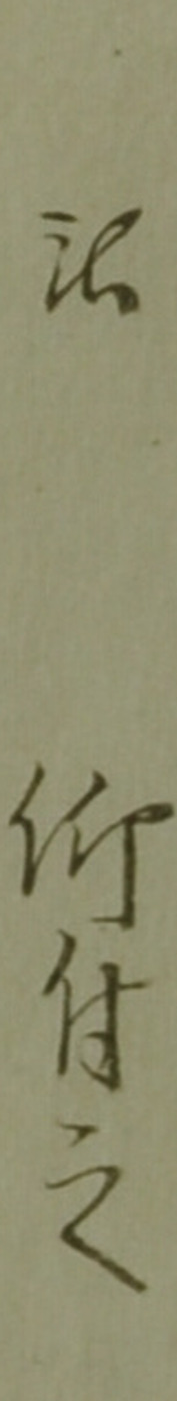役被仰付之

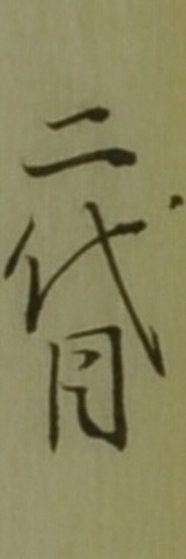二代目
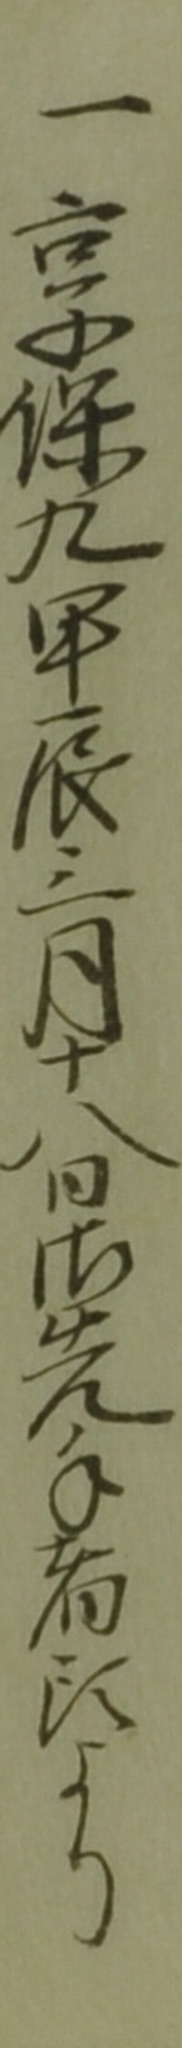一享保九甲辰三月十八日御先手者頭より
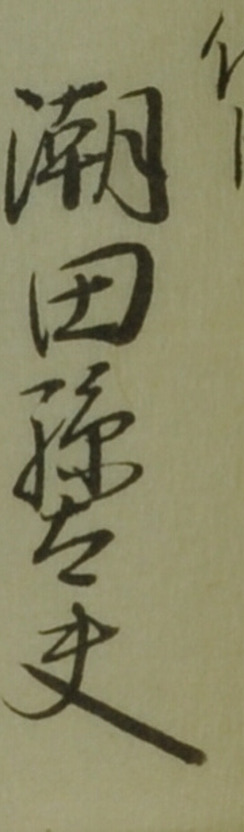潮田孫太夫
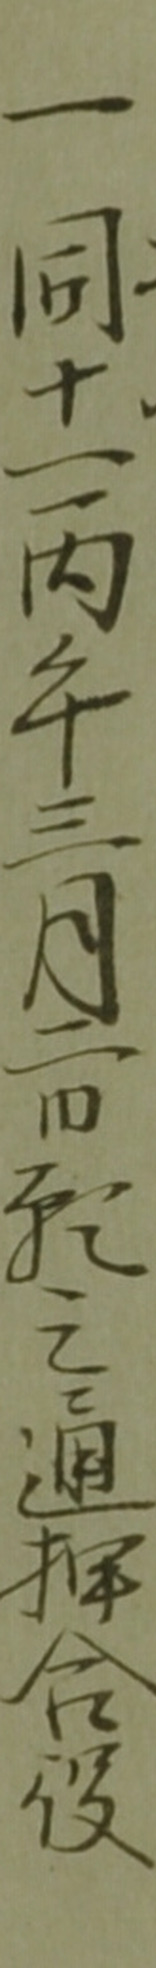一同十一丙午三月二日願之通押合役
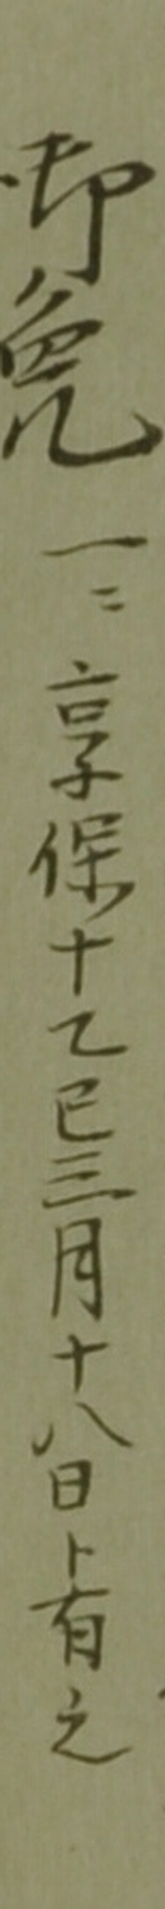御免一ニ享保十乙巳三月十八日ト有之
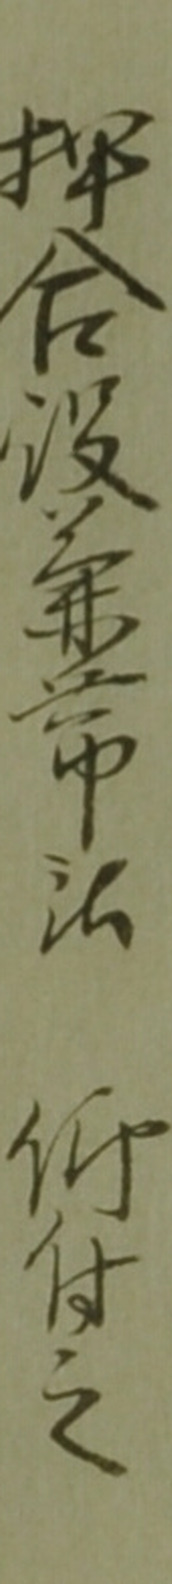押合役兼帯被仰付之
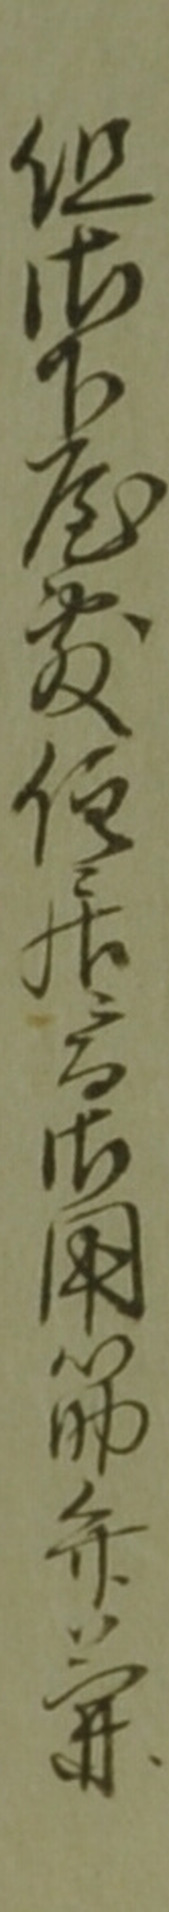但御下屋敷住居而御国筋弁兼
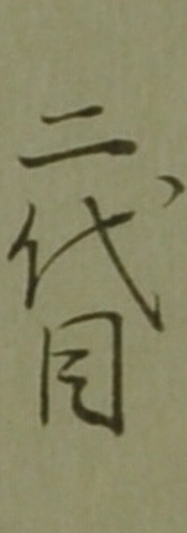二代目
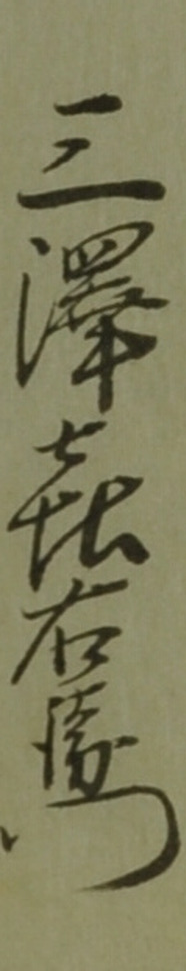三沢喜右衛門
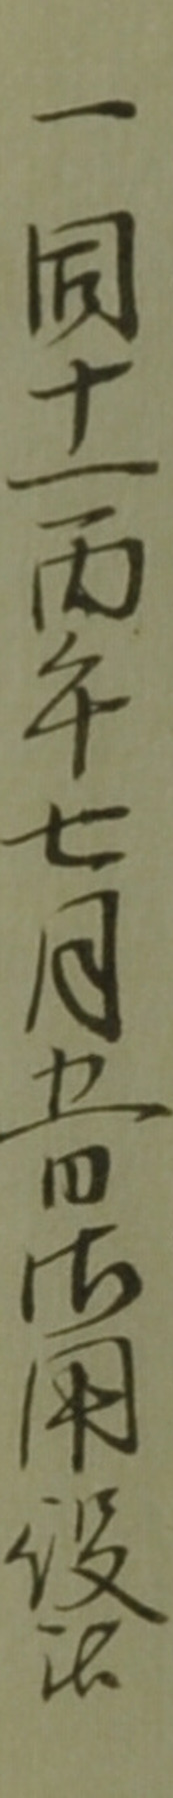一同十一丙午七月五日御用役被
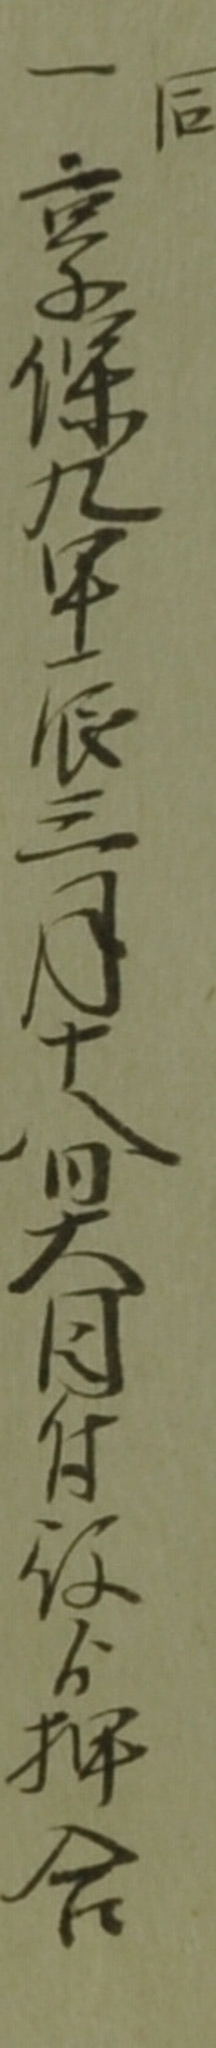一享保九甲辰三月十八日大目付役ゟ押合
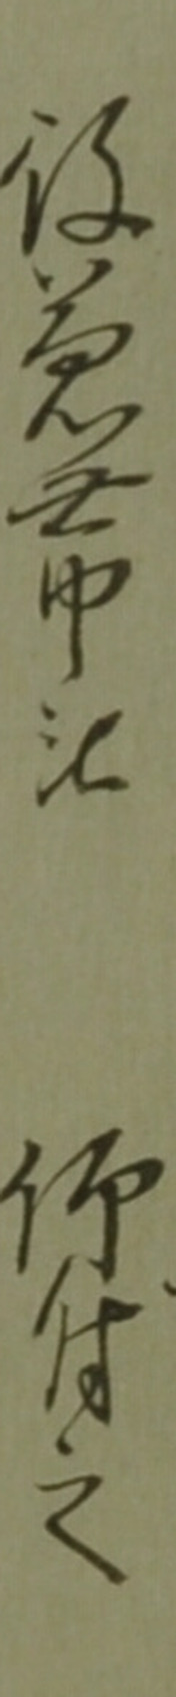役兼帯被仰付之
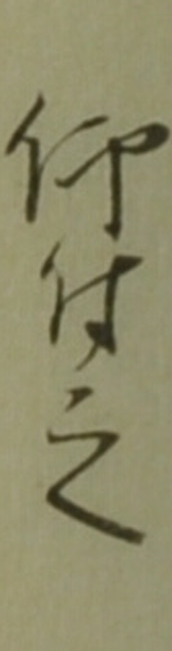仰付之

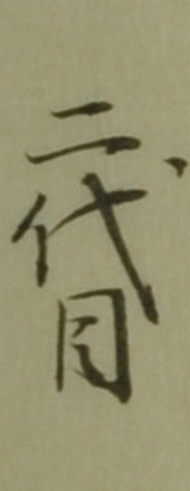二代目
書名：諸御役代々録（七）
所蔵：伊那市立高遠町図書館・合同会社AMANE
